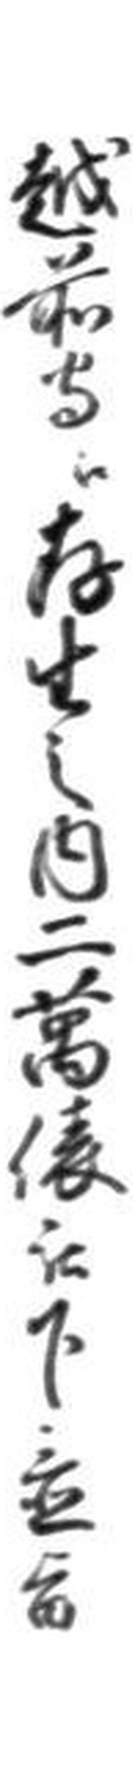越前守江存生之内二万俵被下置旨
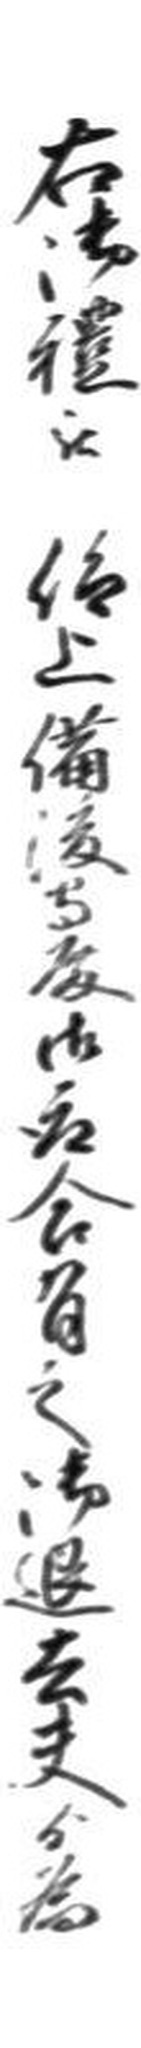右御礼被仰上備後守殿御取合有之御退去夫ゟ為
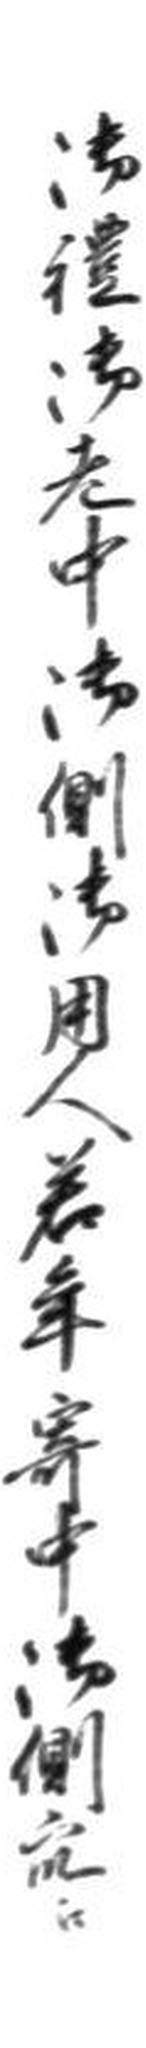御礼御老中御側御用人若年寄中御側衆江
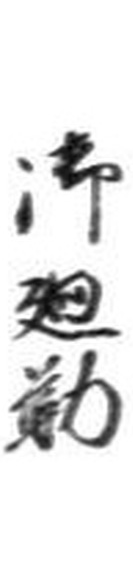御廻勤
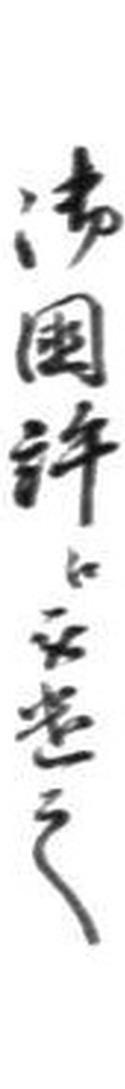御国許江被遣之

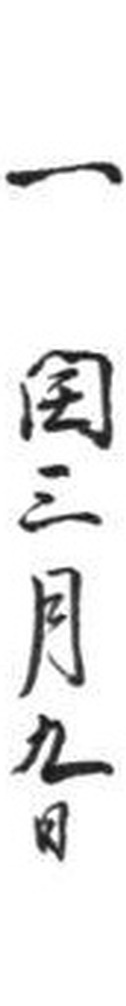一閏三月九日
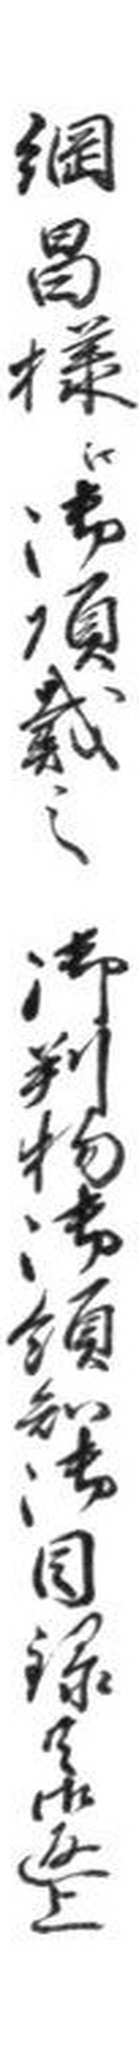綱昌様江御頂戴之御判物御領知御目録共御返上
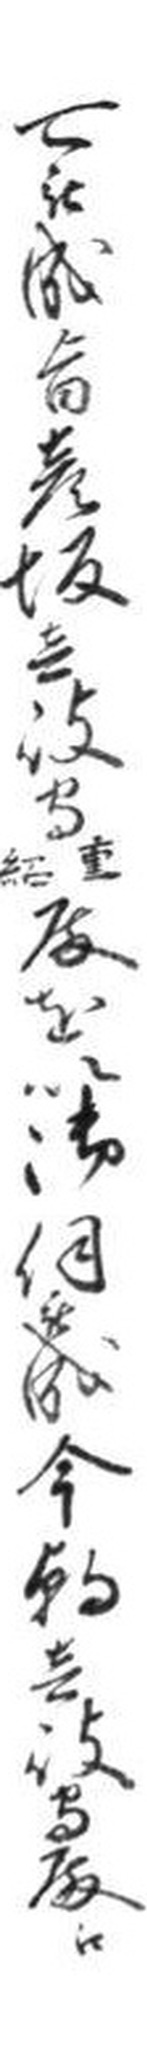可被成旨彦坂壱岐守重紹殿を以御伺被成今朝壱岐守殿江
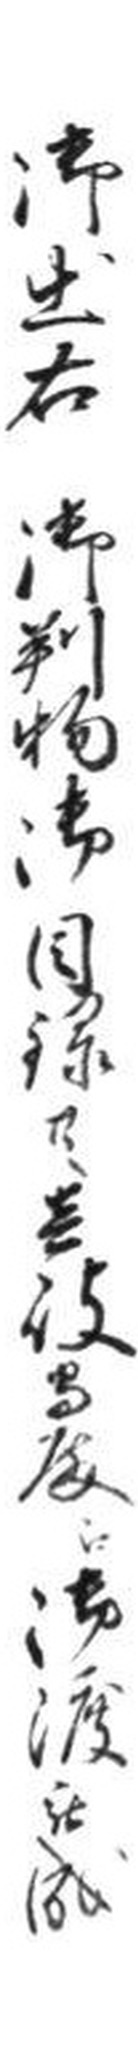御出右御判物御目録共壱岐守殿江御渡被成
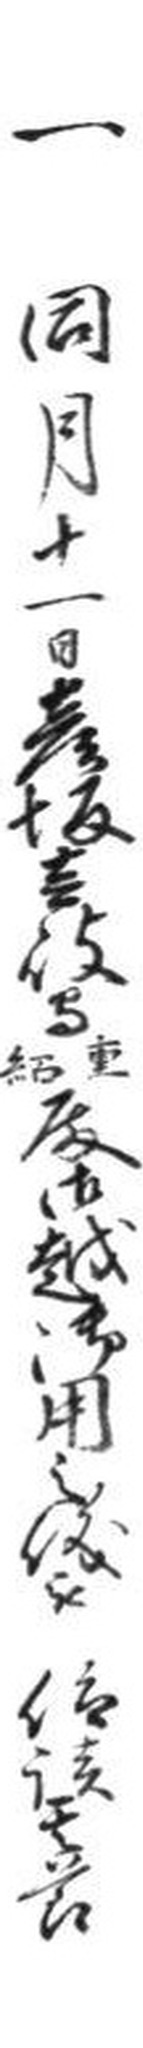一同月十一日彦坂壱岐守重紹殿御越御用之儀被仰談其節
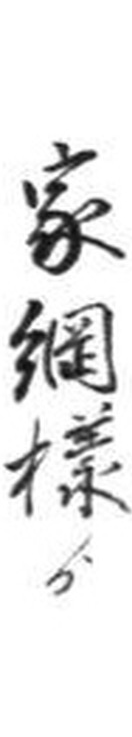家綱様ゟ
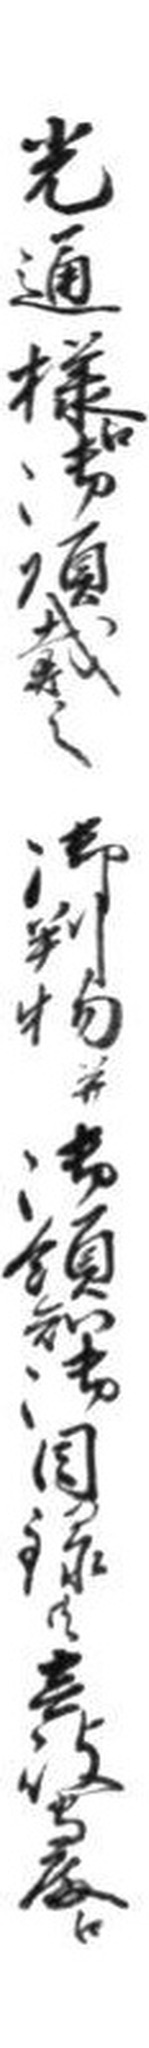光通様江御頂戴之御判物并御領知御目録共壱岐守殿江
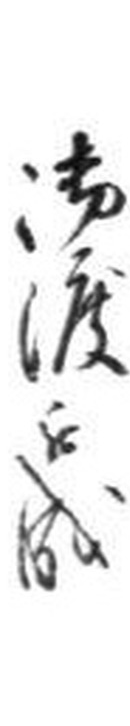御渡被成
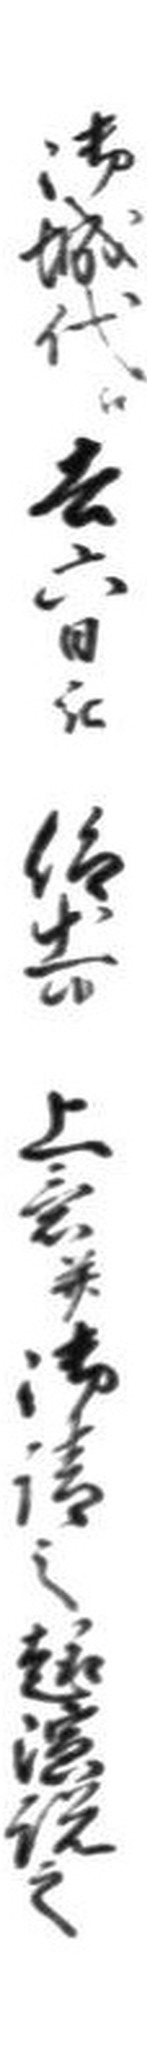御城代江去六日被仰出候上意并御請之趣演説之
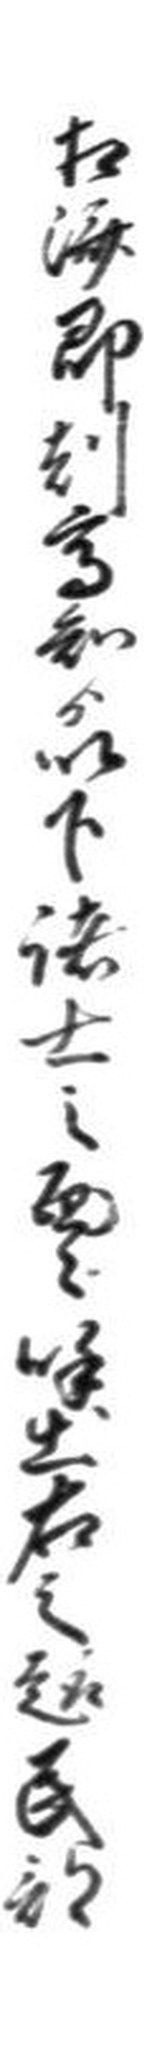相済即刻高知ゟ以下諸士之面々呼出右之趣民部
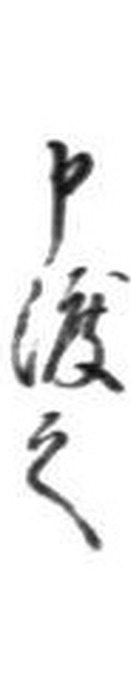申渡之
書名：家譜 十六 吉品公 従貞享三年閏三月到同四年
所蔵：福井県文書館 Fukui Prefectural Archives
